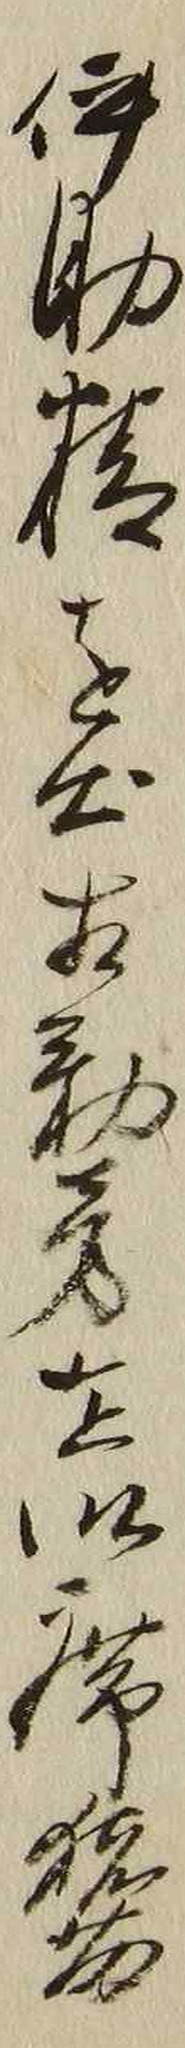伊助精を出相勤旁を以席猪苗
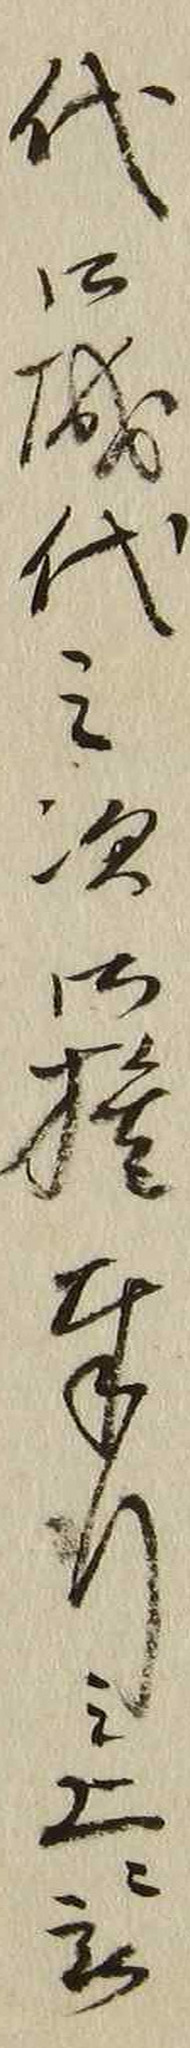代御城代之次御旗奉行之上ニ被
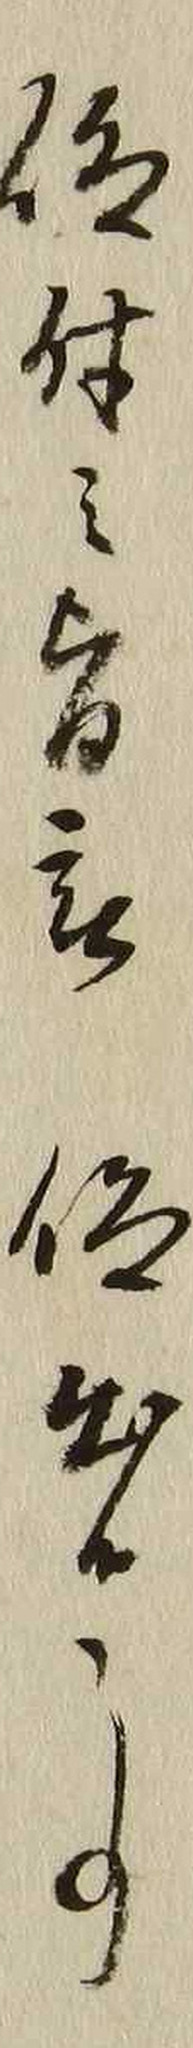仰付之旨被仰出候事
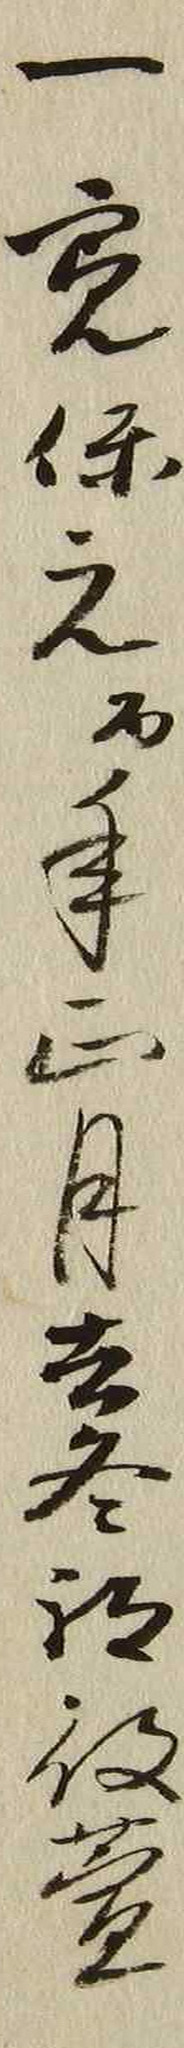一寛保元酉年正月去冬跡役萱
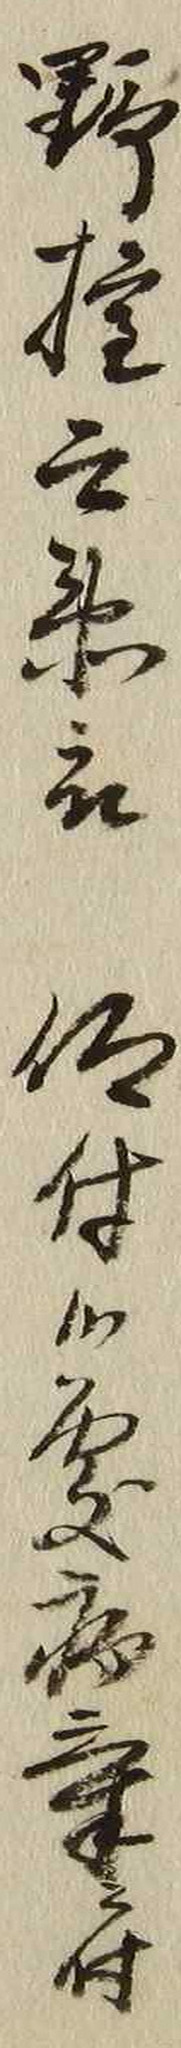野権兵衛被仰付候処病気ニ付
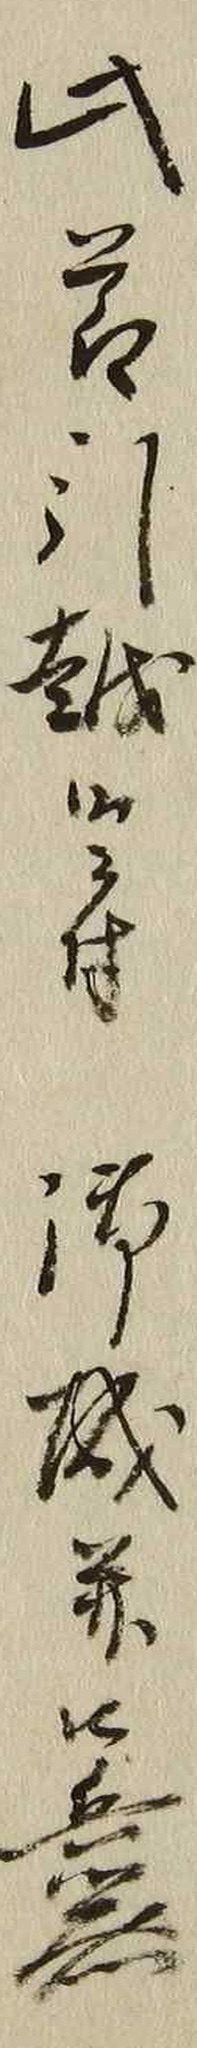此節引越候ニ付御城并御兵器
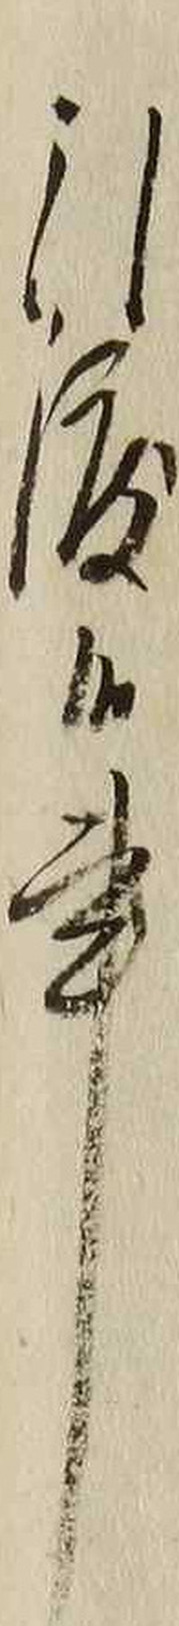引渡候事
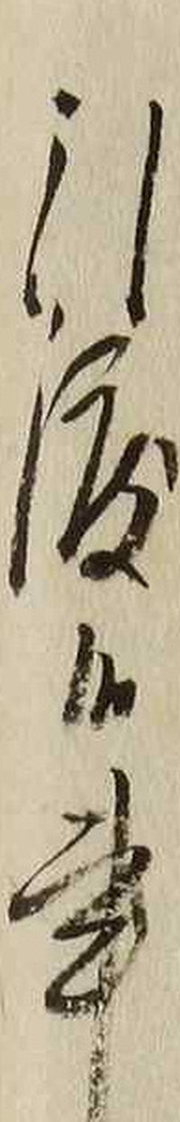引渡候事
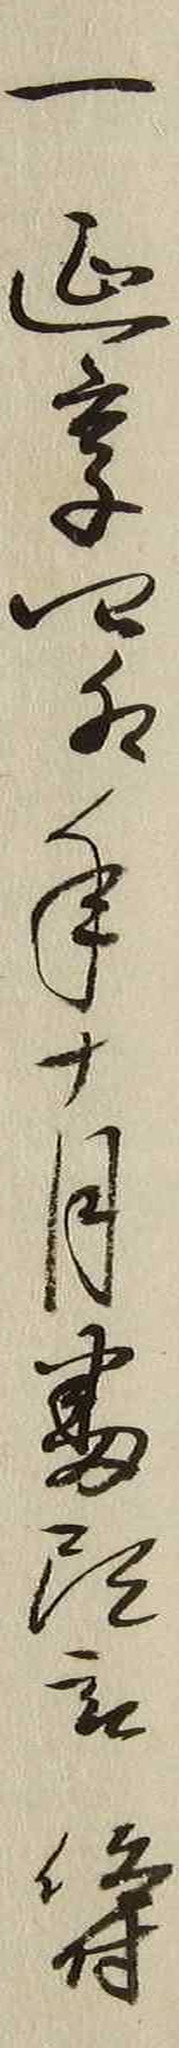一延享四卯年十月番頭被仰付
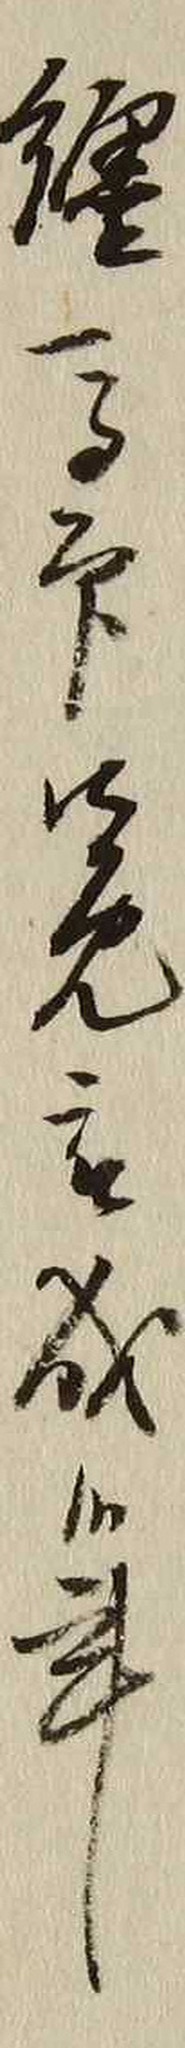纏馬印御免被成候事
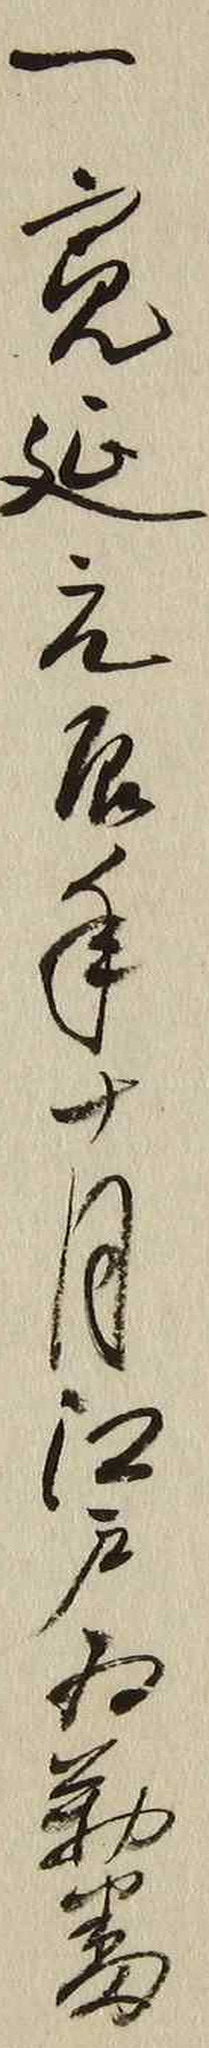一寛延元辰年十月江戸為勤番
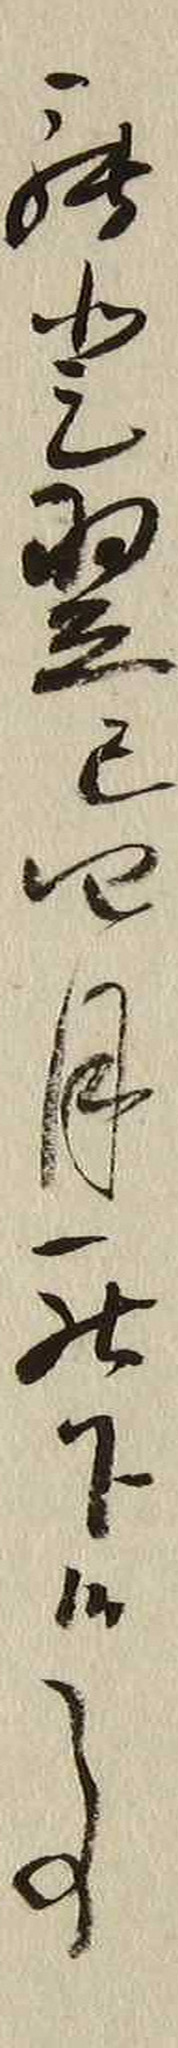罷登翌巳四月罷下候事
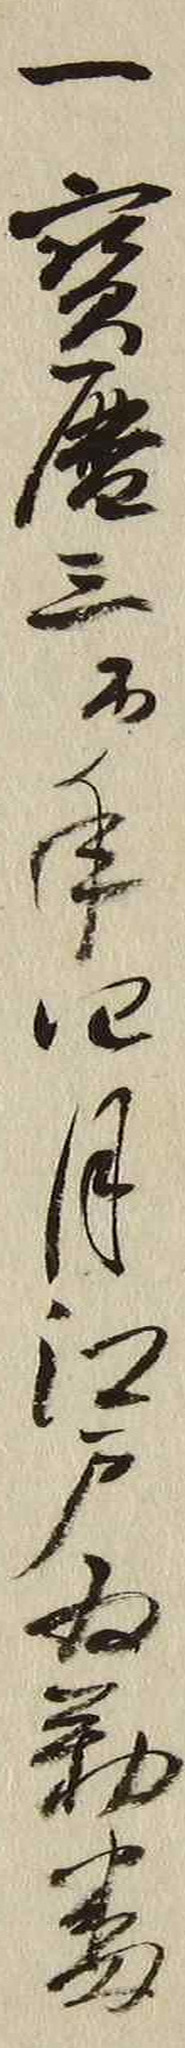一宝暦三酉年四月江戸為勤番
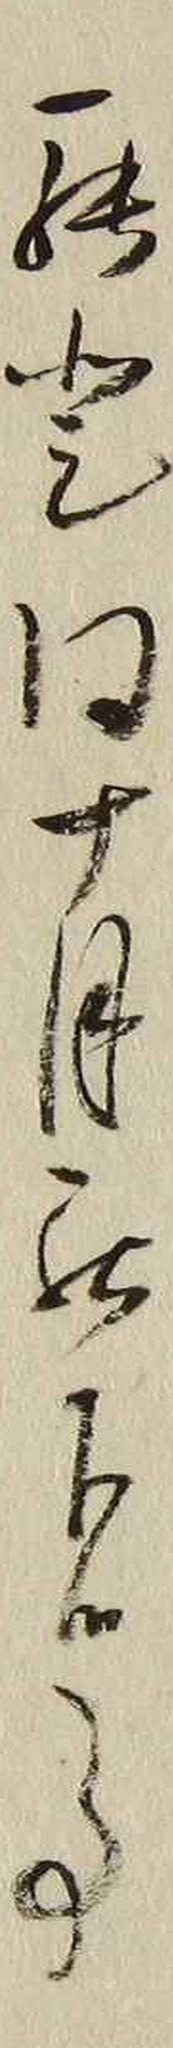罷登同十月罷下候事
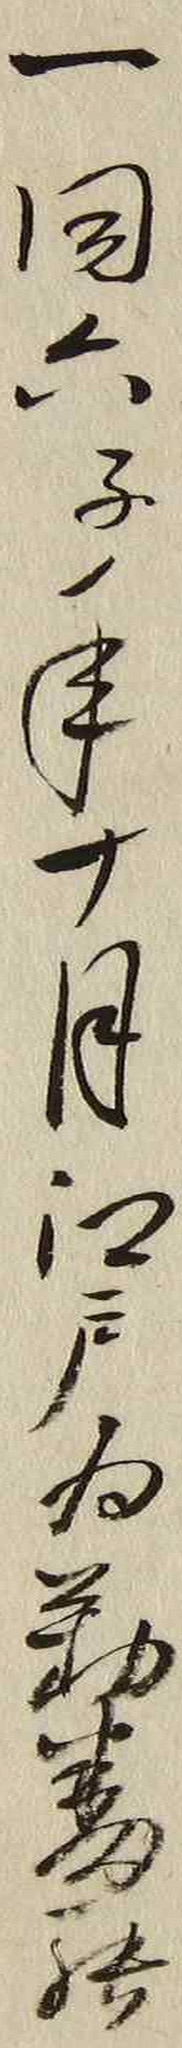一同六子年十月江戸為勤番罷
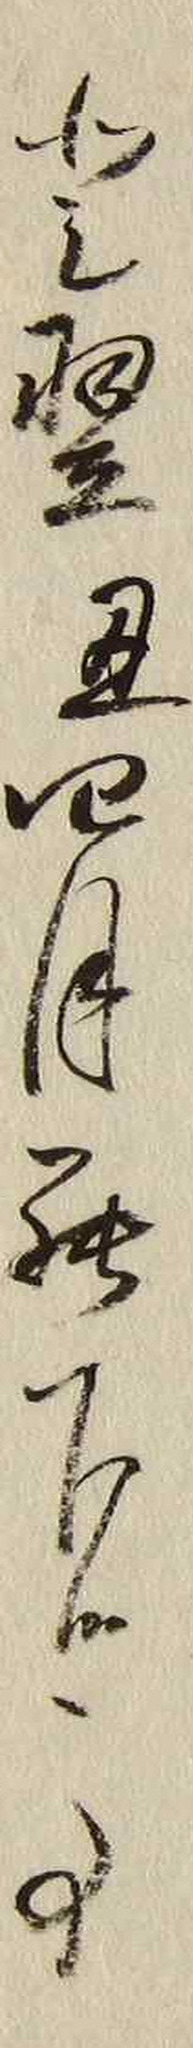登翌丑四月罷下候事
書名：諸士系譜　巻之351　す之部1
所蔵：会津若松市立会津図書館
